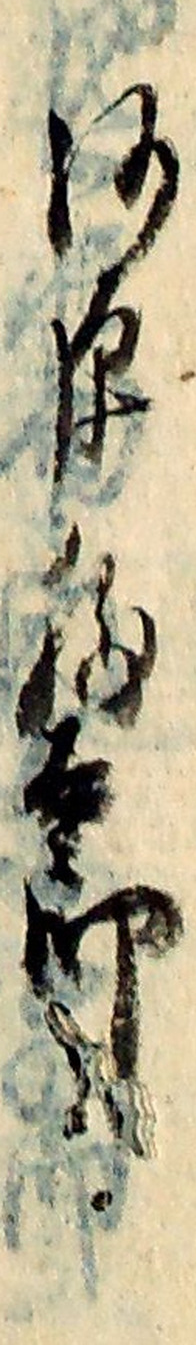河原孫太郎
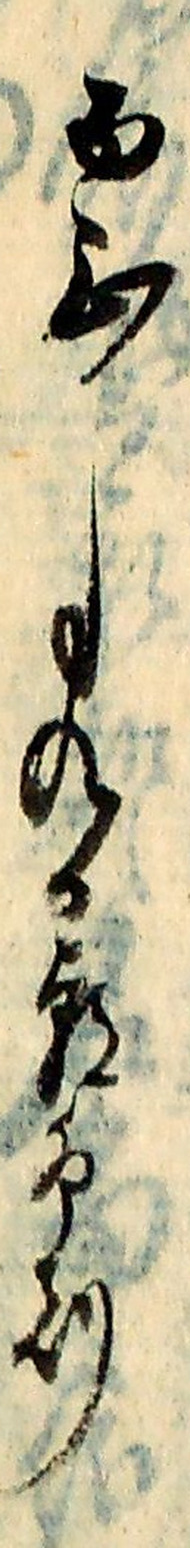酉正月九日朝卯刻
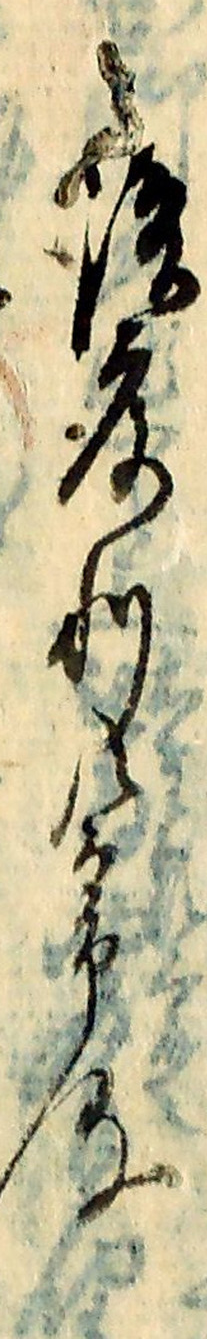後藤利八郎
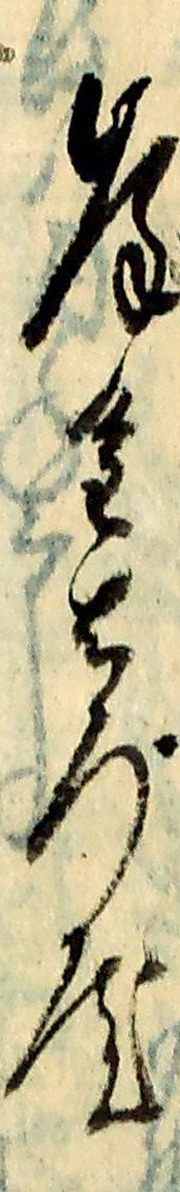岸金右衛門殿
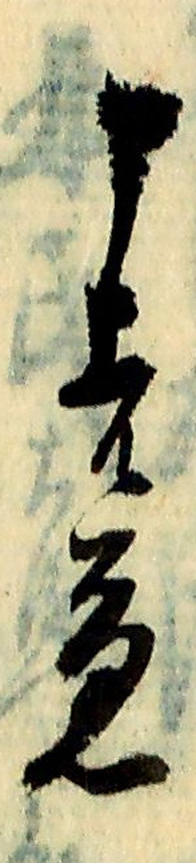申上る覚
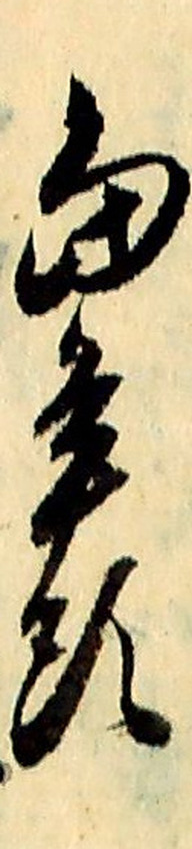当年頭
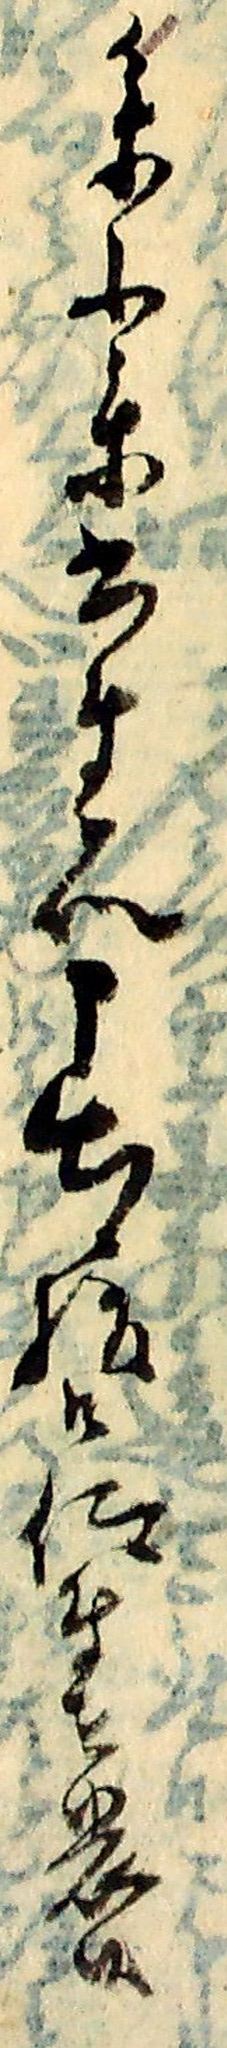参不参書付を以申出候様被仰付奉畏候
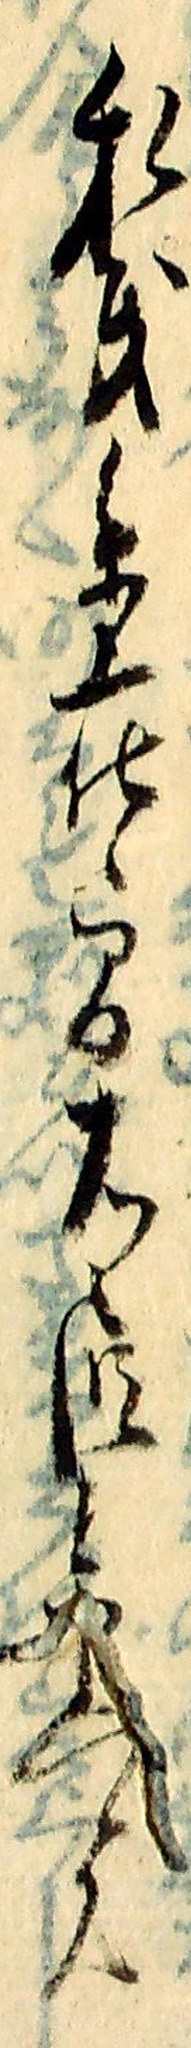私義参上仕候間右之段奉申上候以上
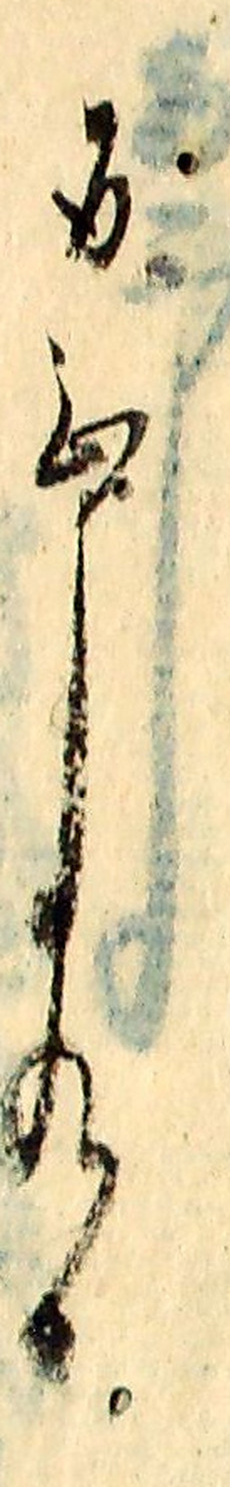酉正月九日
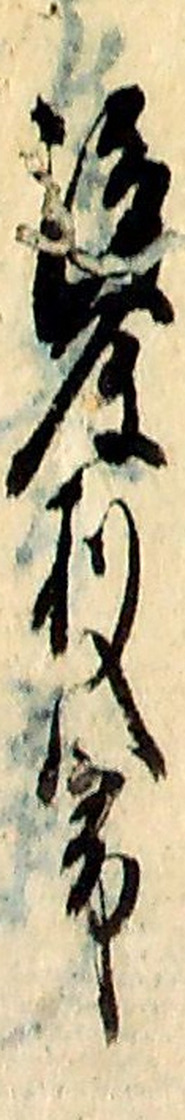後藤利八郎

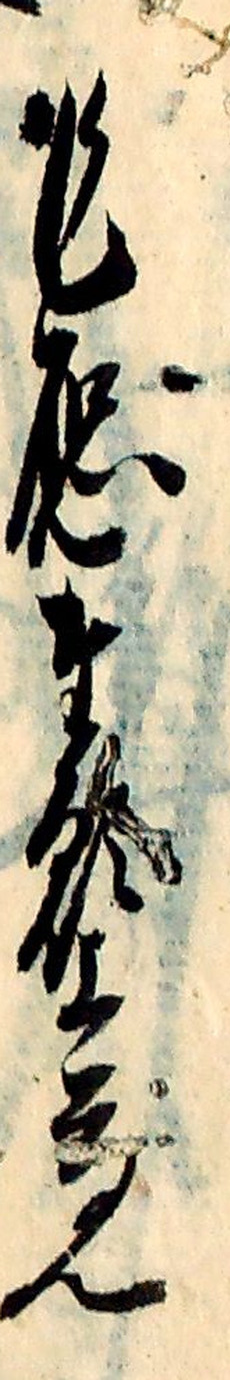乍恐奉願上覚
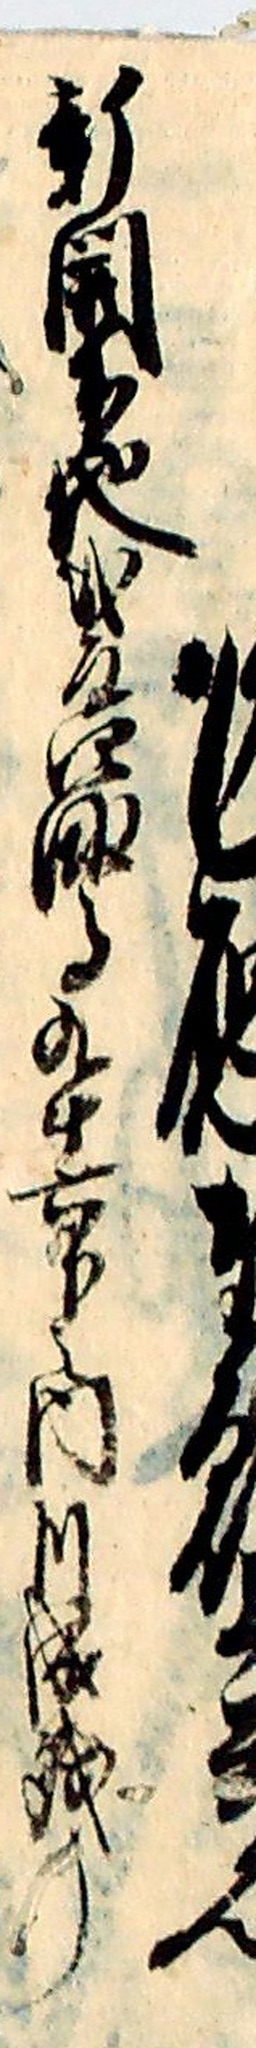新開下地弐反四畝高九斗六升之内川成残り
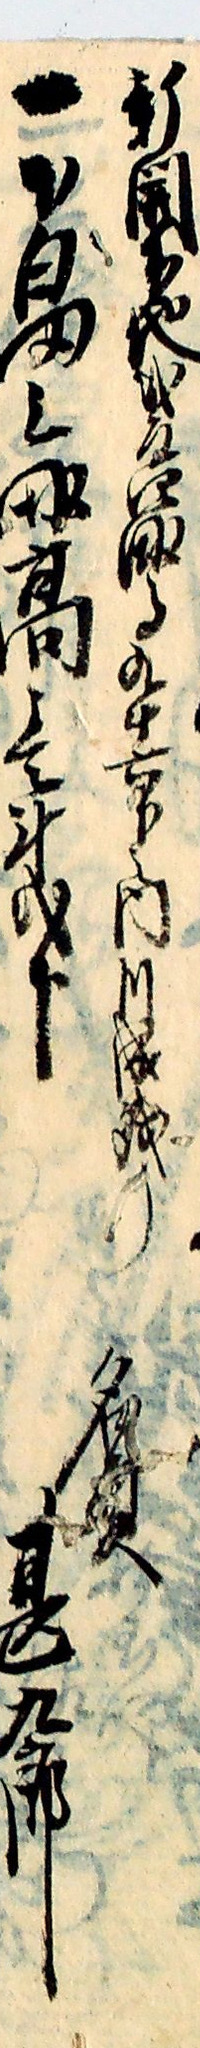一下畠三畝高壱斗弐升名負
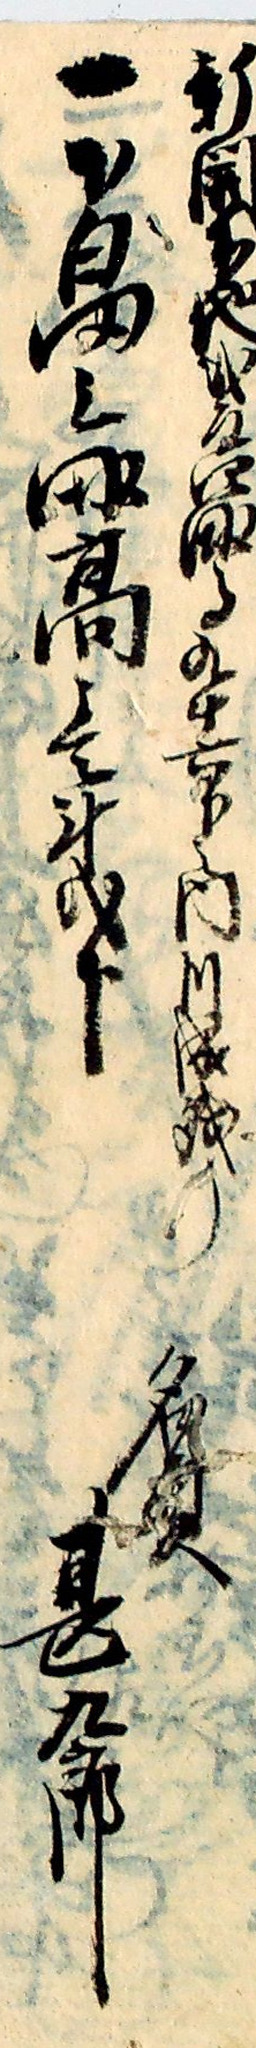一下畠三畝高壱斗弐升名負
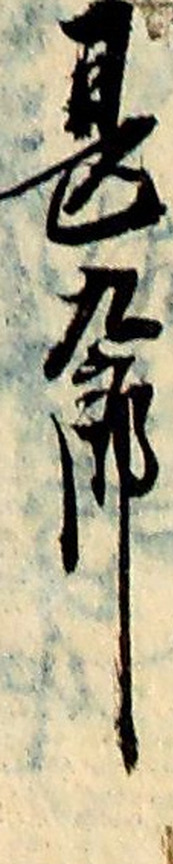甚九郎
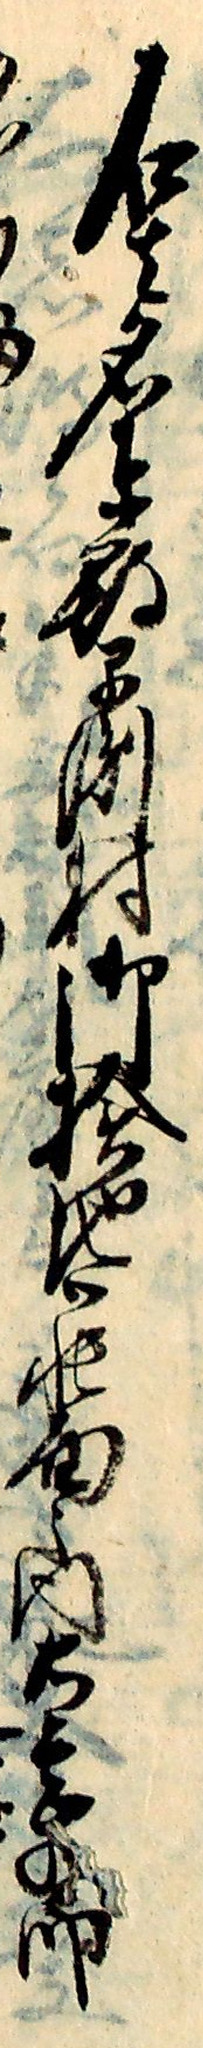右は名東郡早淵村御検地御帳面之内右甚九郎
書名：諸御願書控(後藤氏壱番）
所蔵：鳴門教育大学 Naruto University of Education
